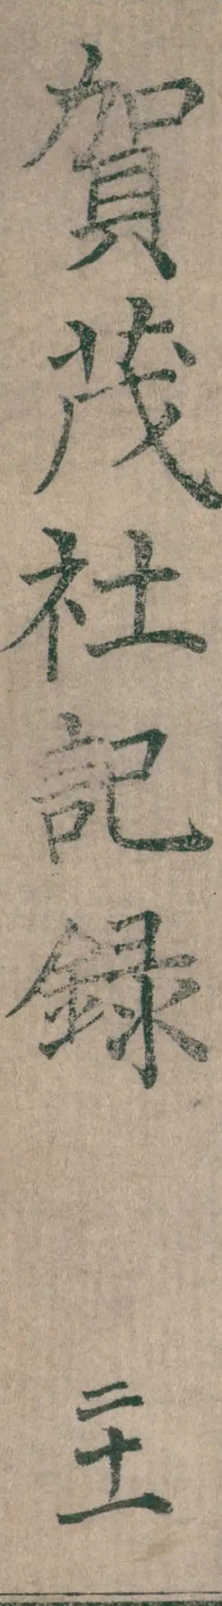賀茂社記録二十一
